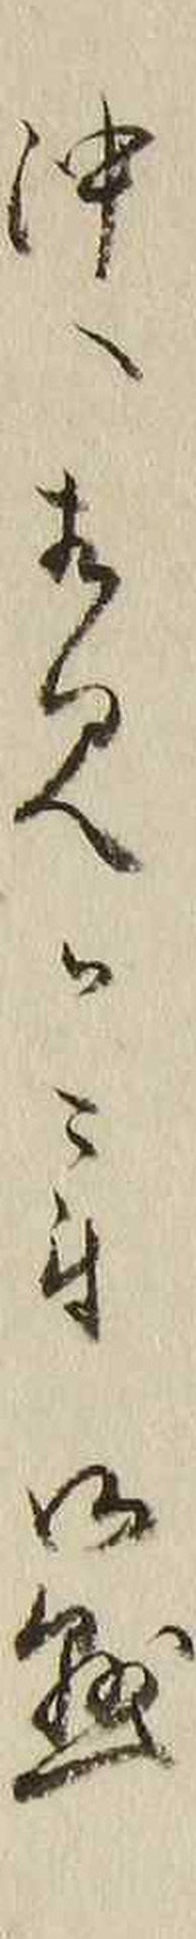沖へ相見候ニ付御懸被
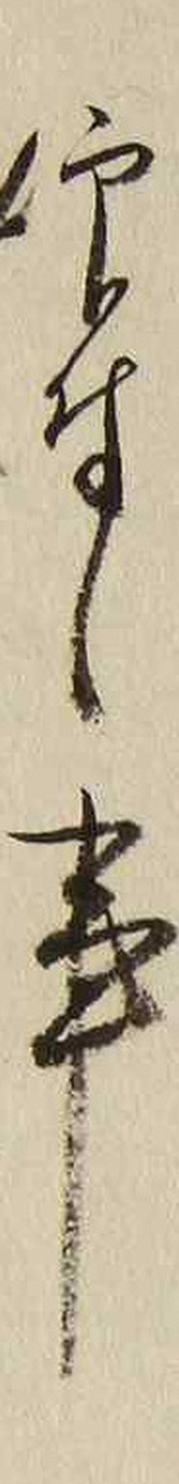仰付候事
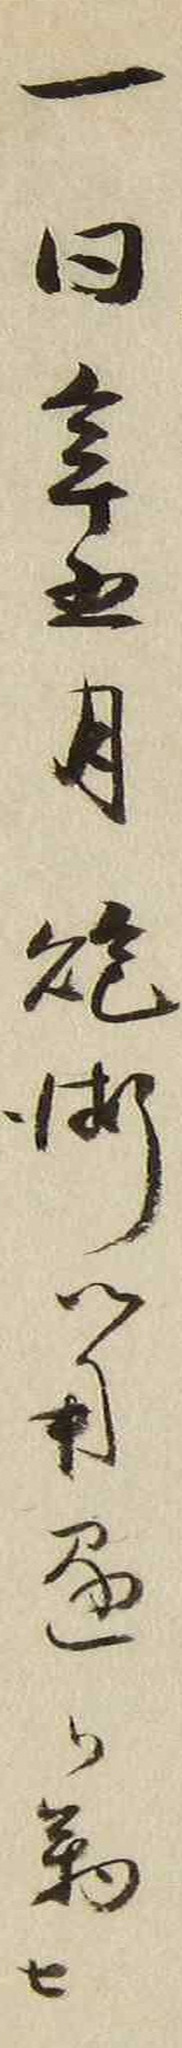一同年五月砲術御用懸り勤被
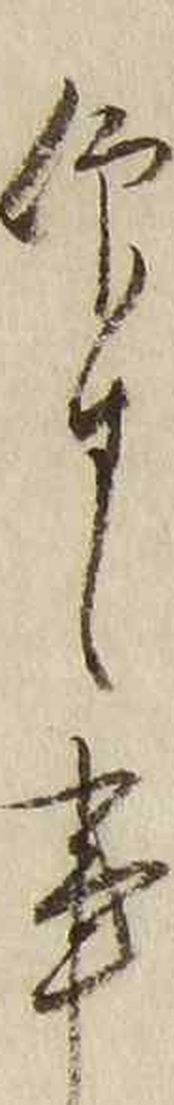仰付候事

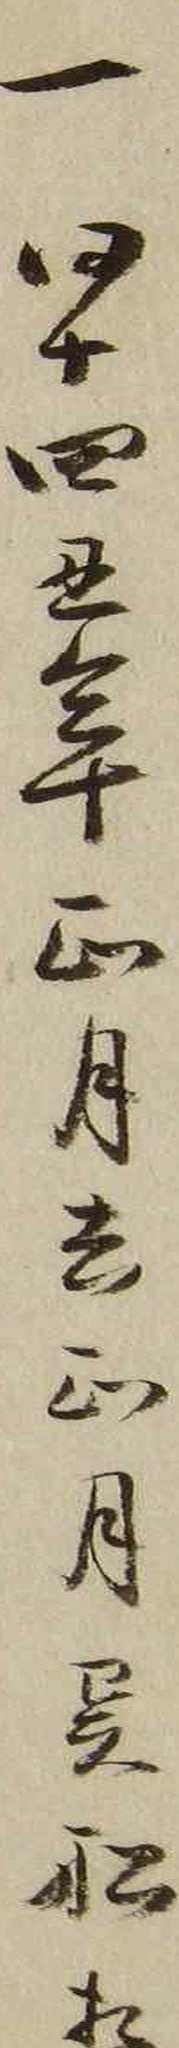一同十四丑年正月去正月異船相
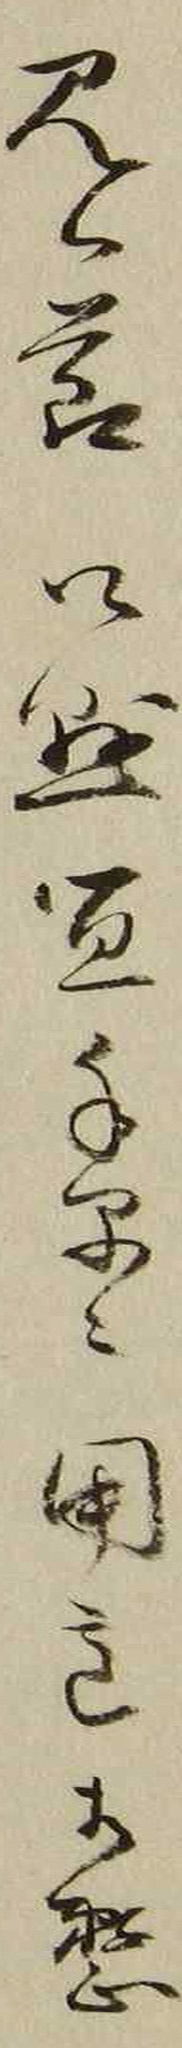見候節御懸宜手早ニ用意相整
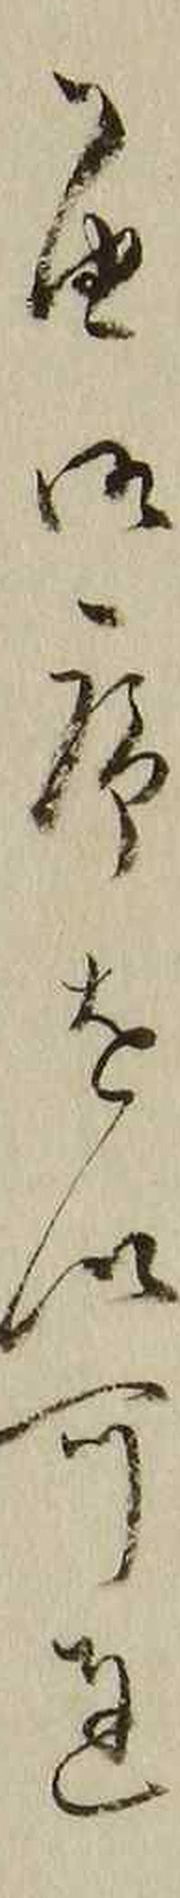候由御序を以可達
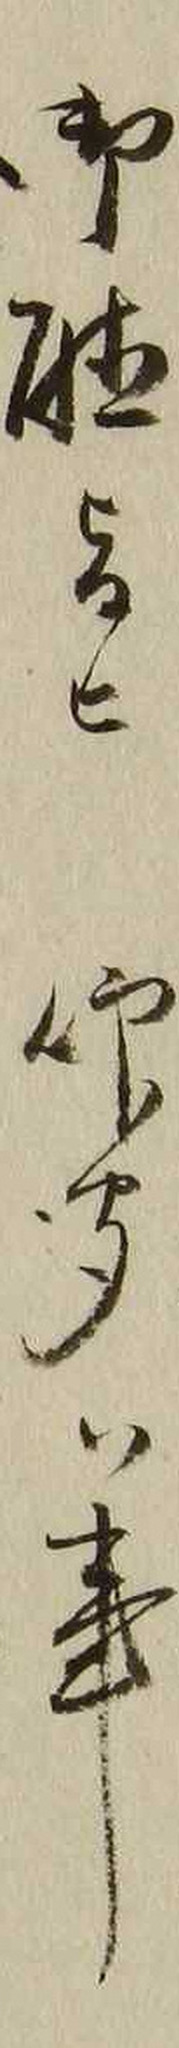御聴旨被仰聞候事
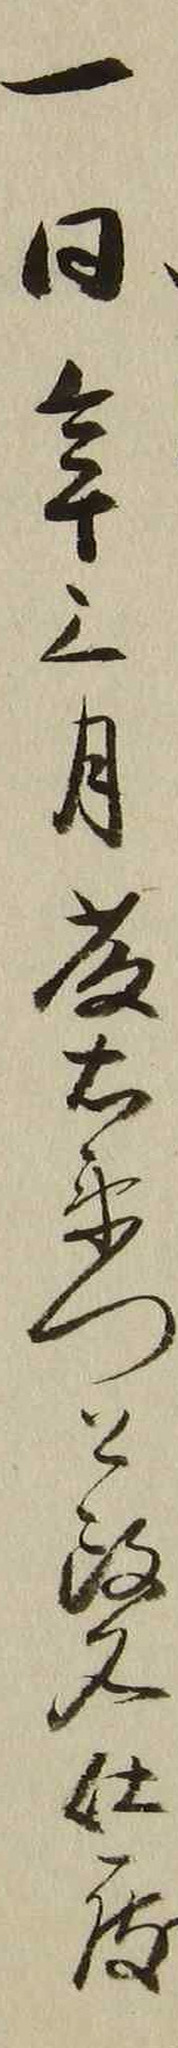一同年三月藤右衛門と改名仕度
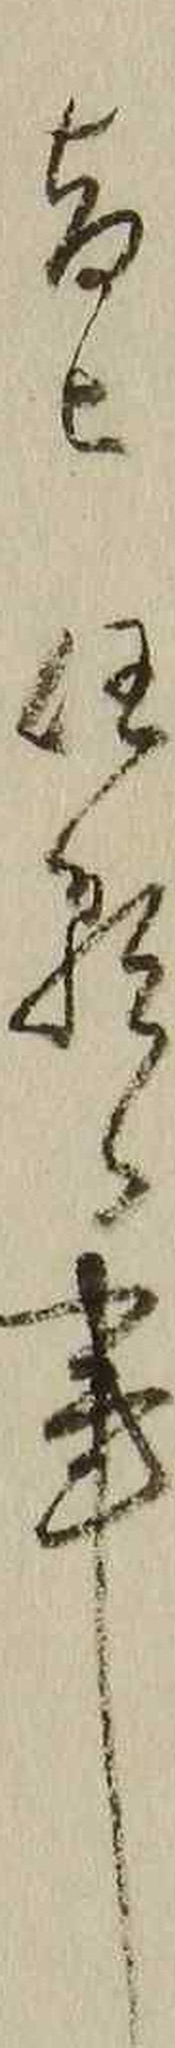旨被任願候事
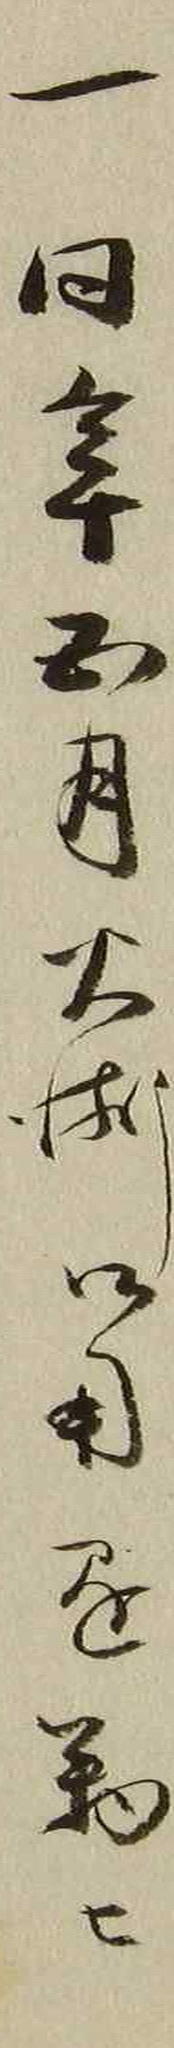一同年五月火術御用懸勤被
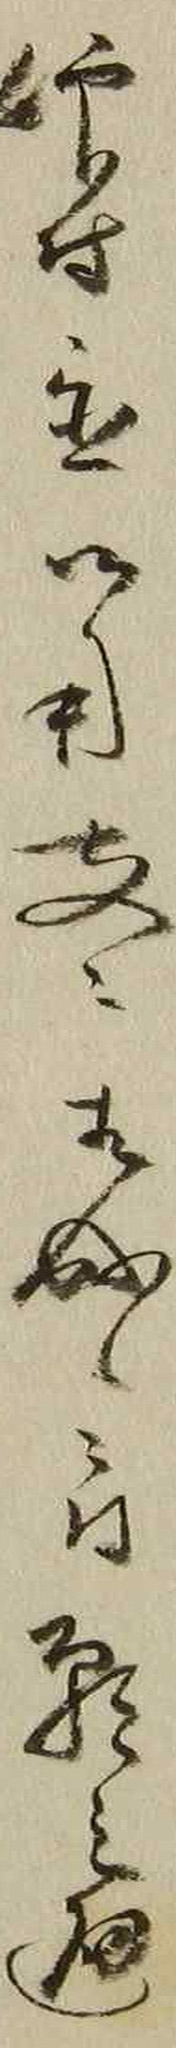仰付置御用支ニ相成候ニ付願之通
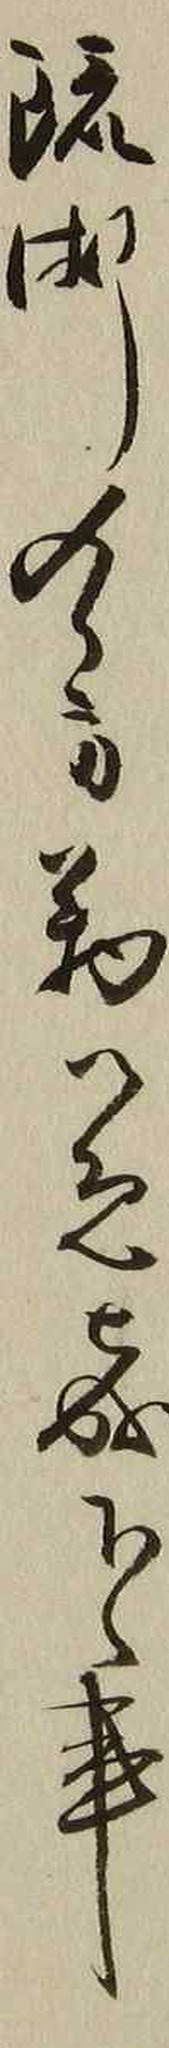銃術〆り方勤御免被成下候事
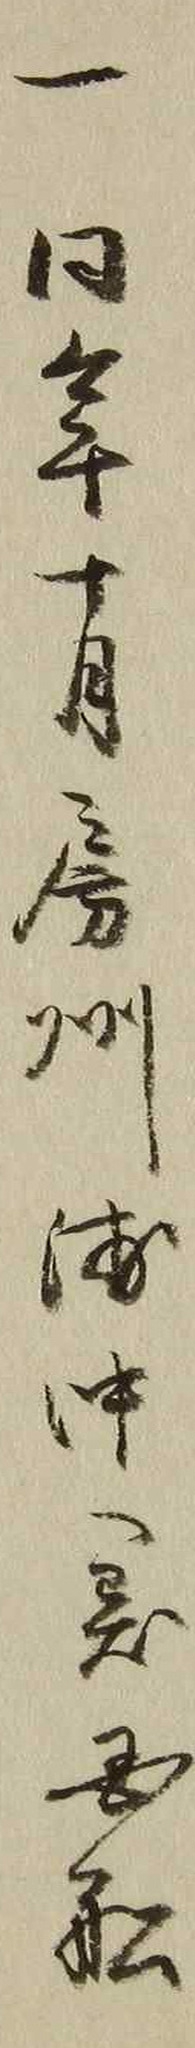一同年十月房州浦沖へ異国船
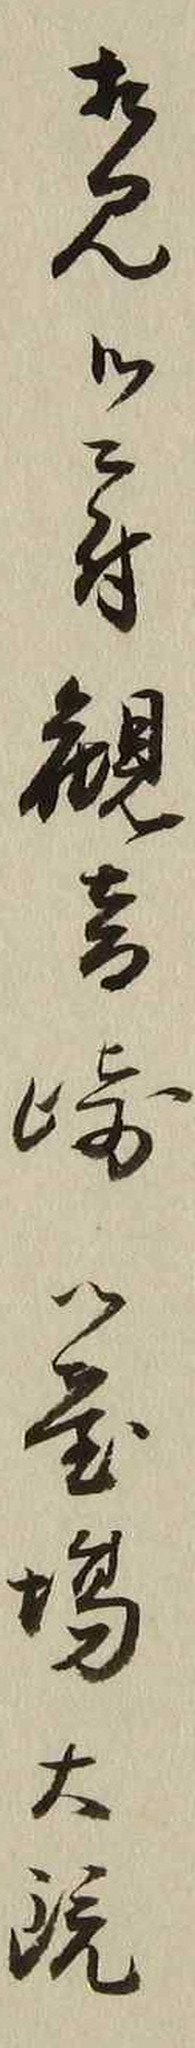相見候ニ付観音崎御台場大銃
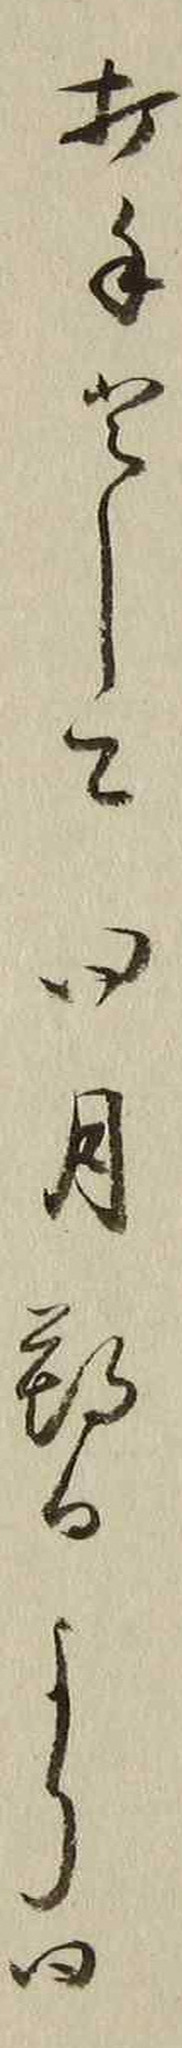打手として同月朔日より同
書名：諸士系譜　巻之288　さ之部20
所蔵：会津若松市立会津図書館
